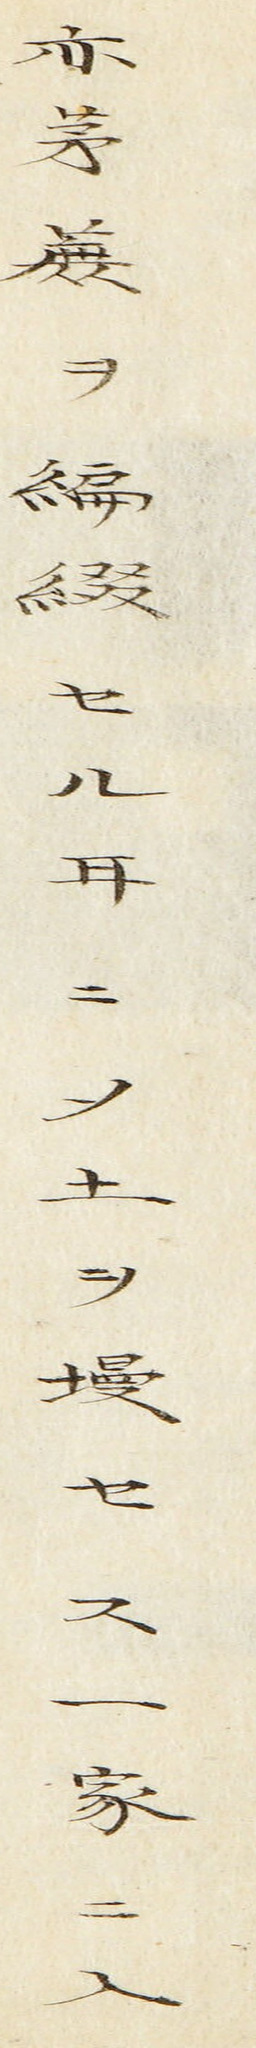亦茅蔗ヲ編綴セル耳ニシテ土ヲ墁セス一家ニ入
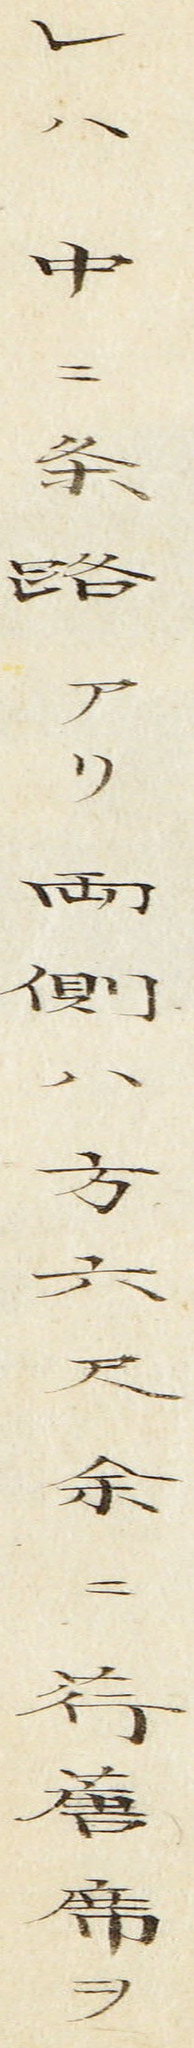レハ中ニ条路アリ両側ハ方六尺余ニ荇蓎席ヲ
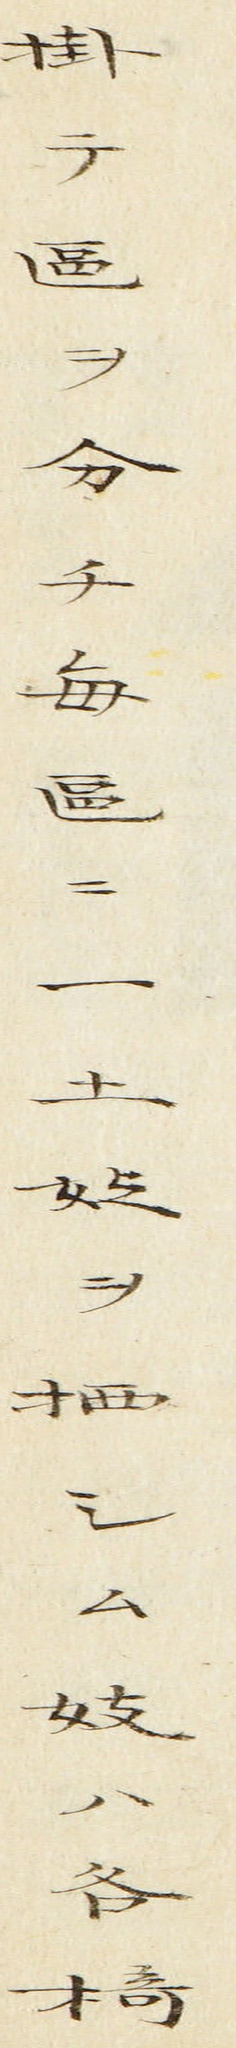掛テ区ヲ分チ毎区ニ一土妓ヲ栖シム妓ハ各椅

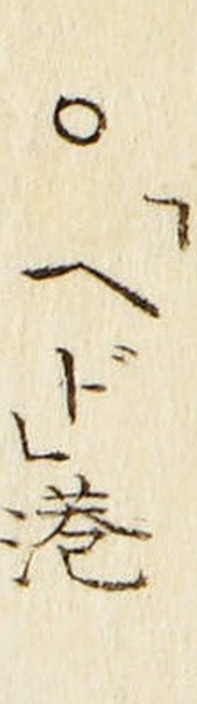◦「ヘド」港
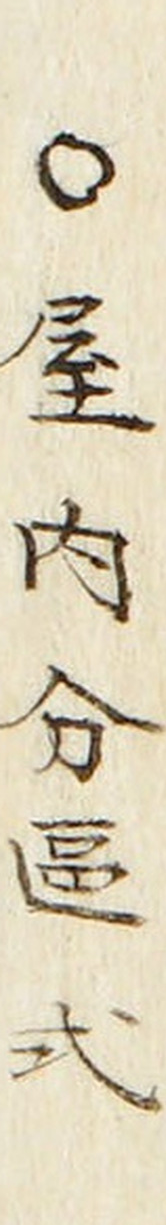◦屋内分区式
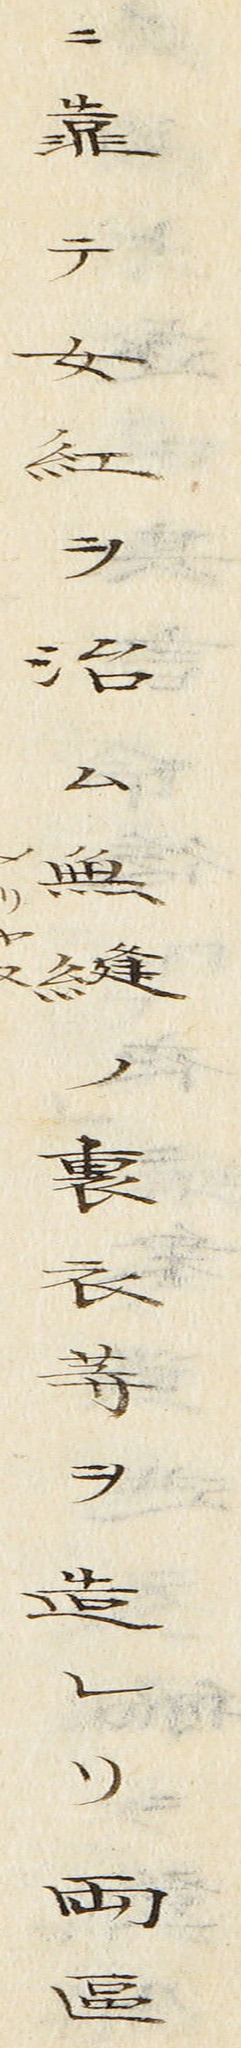ニ靠テ女紅ヲ治ム無縫ノ裏衣等ヲ造レリ両区
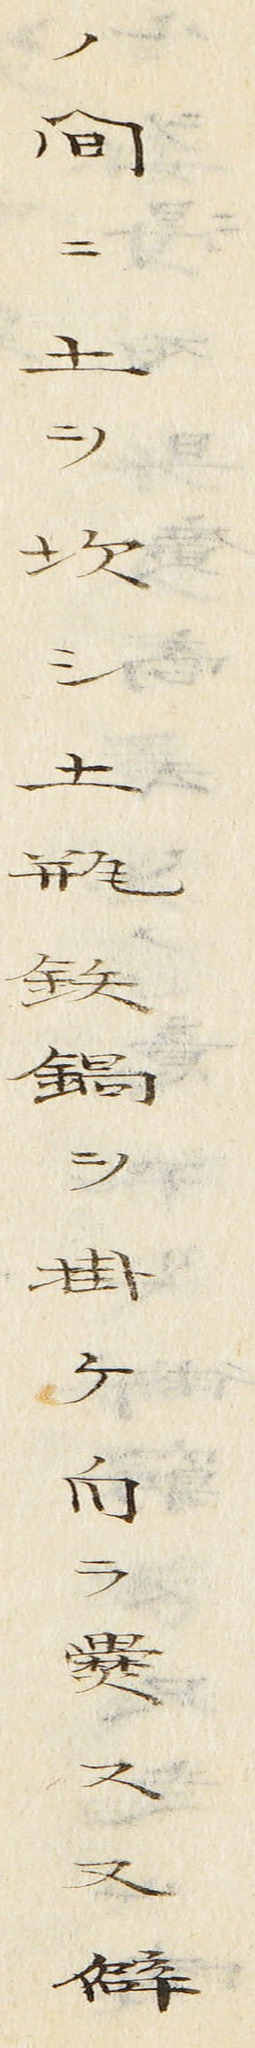ノ間ニ土ヲ坎シ土瓶鉄鍋ヲ掛ケ自ラ㸑ス亦僻
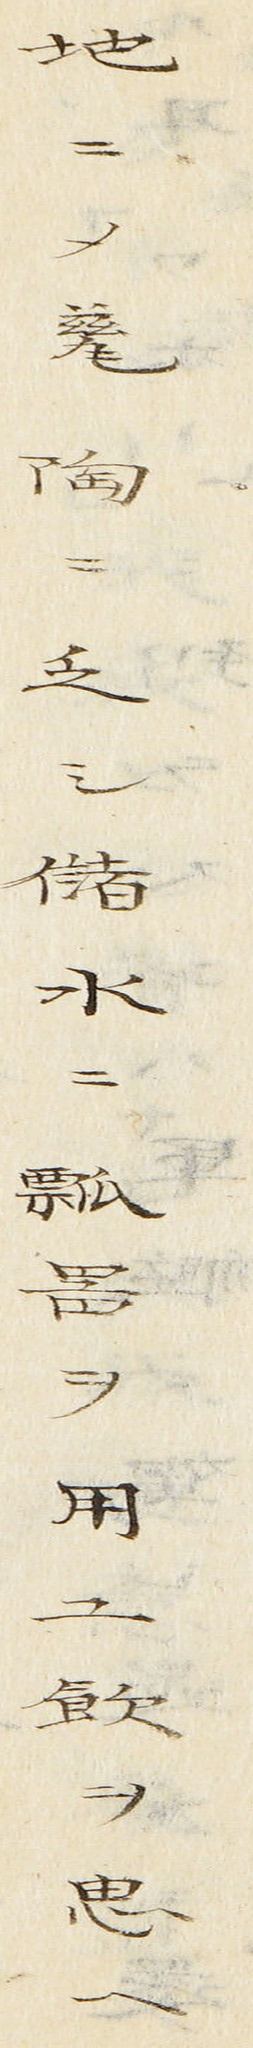地ニシテ甆陶ニ乏シ儲水ニ瓢器ヲ用ユ飲ヲ思へ
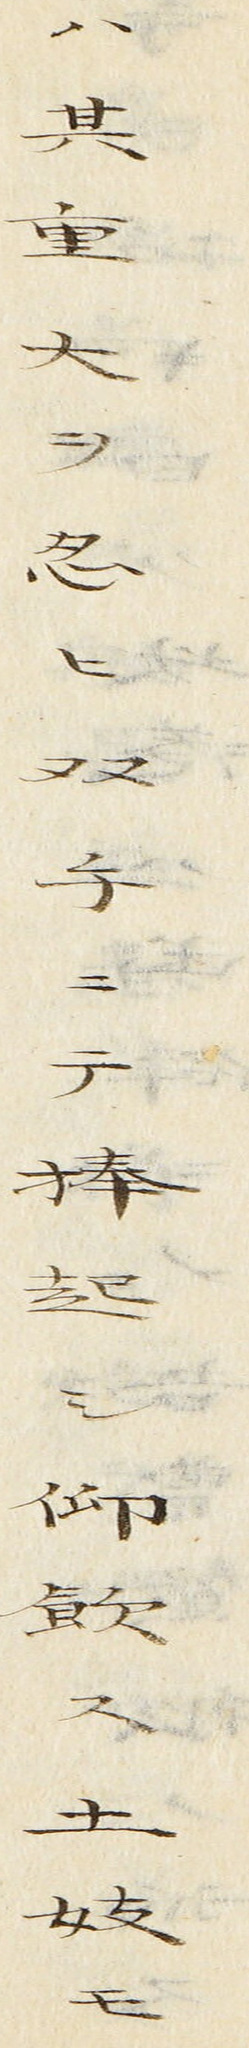ハ其重大ヲ忍ヒ双手ニテ捧起シ仰飲ス土妓モ
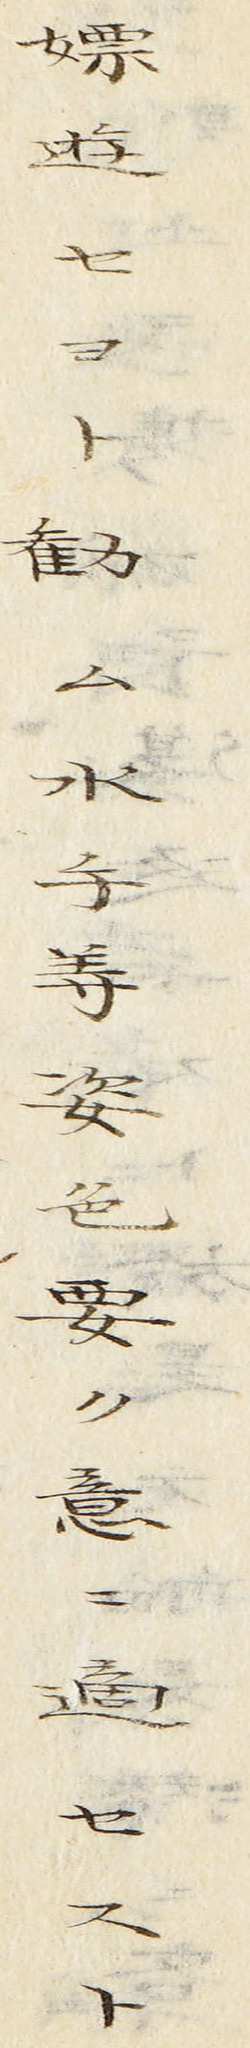嫖遊セヨト勧ム水手等姿色要ク意ニ適セスト
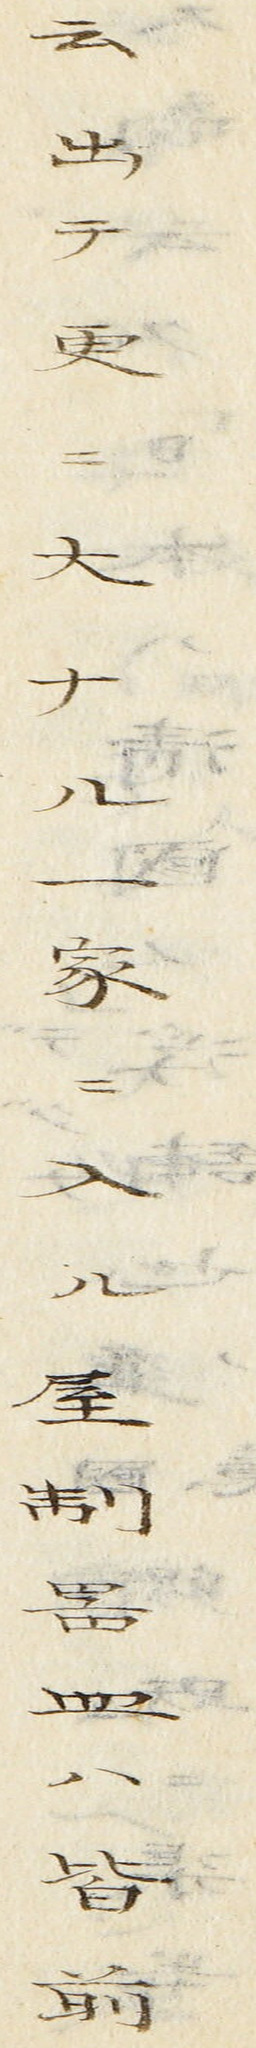云出テ更ニ大ナル一家ニ入ル屋制器皿ハ皆前
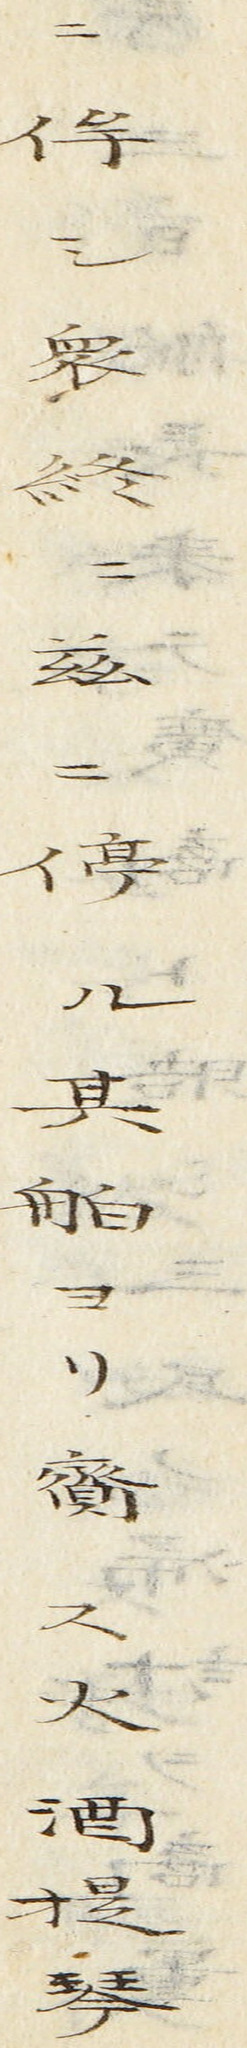ニ侔シ衆終ニ茲ニ停ル其舶ヨリ齎ス火酒提琴
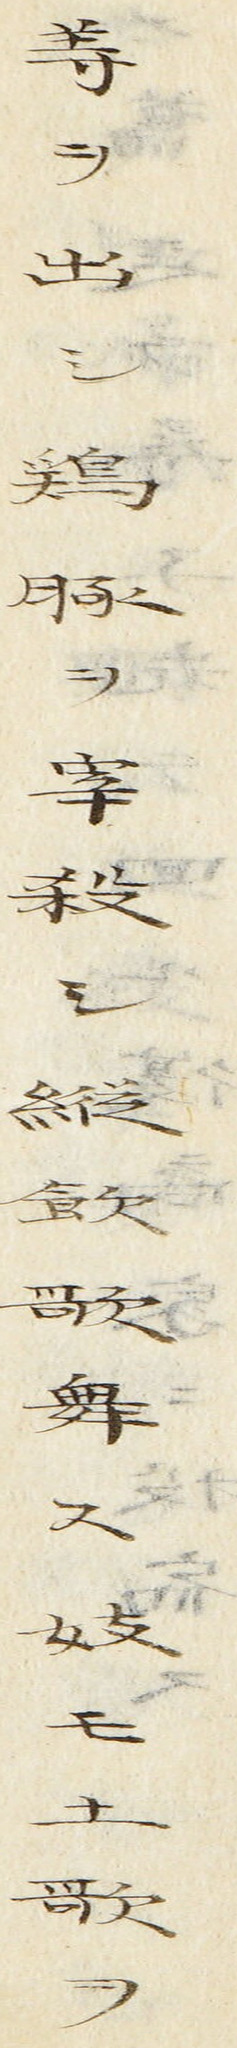等ヲ出シ鶏豚ヲ宰殺シ縦飲歌舞ス妓モ土歌ヲ
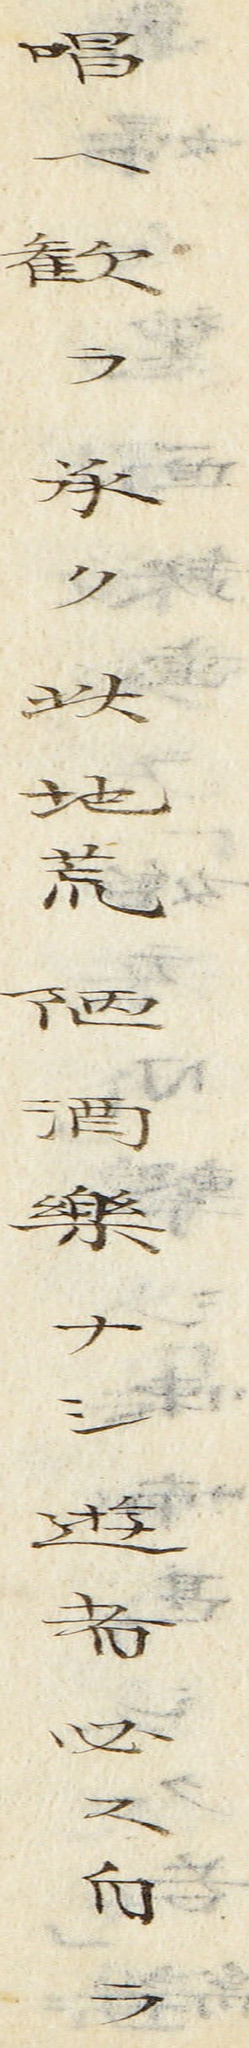唱ヘ歓ヲ承ク此地荒陋酒楽ナシ遊者必ス自ラ
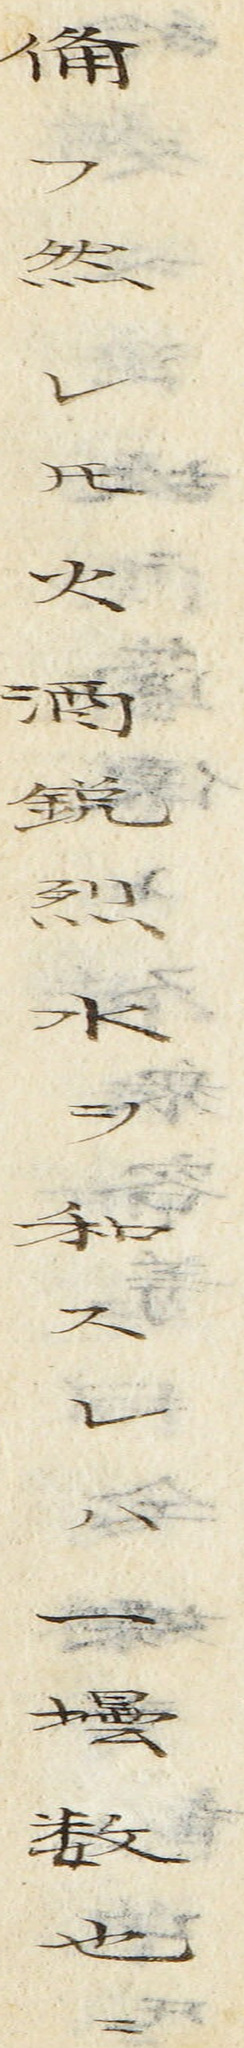備フ然レトモ火酒鋭烈水ヲ和スレハ一壜数也ニ

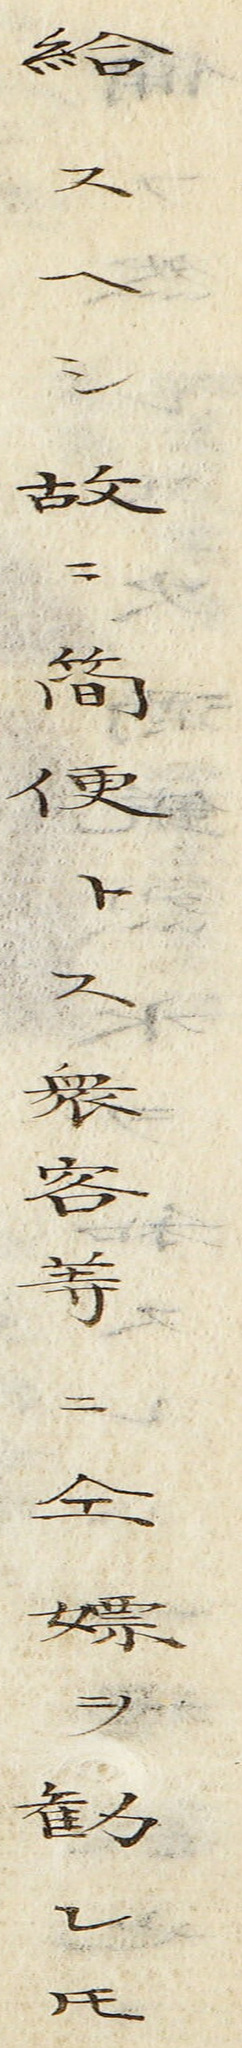給スヘシ故ニ簡便トス衆客等ニ同嫖ヲ勧レトモ
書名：蕃談
